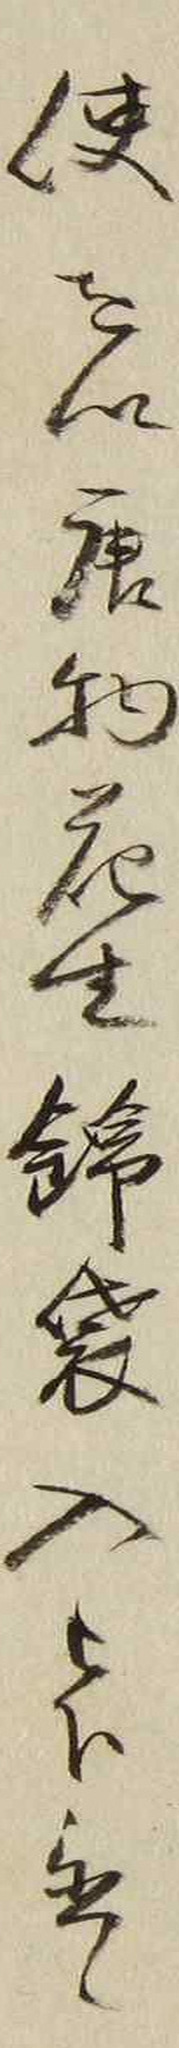使を以唐物花生錦袋入被下置候

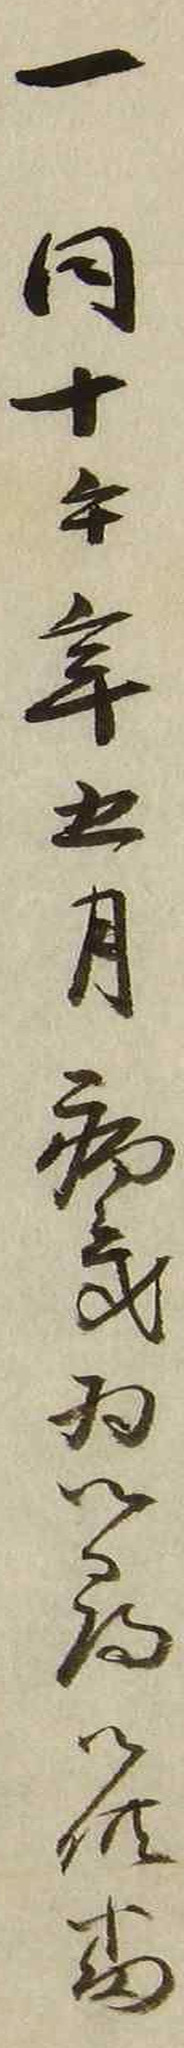一同十午年五月病気為御尋御供番
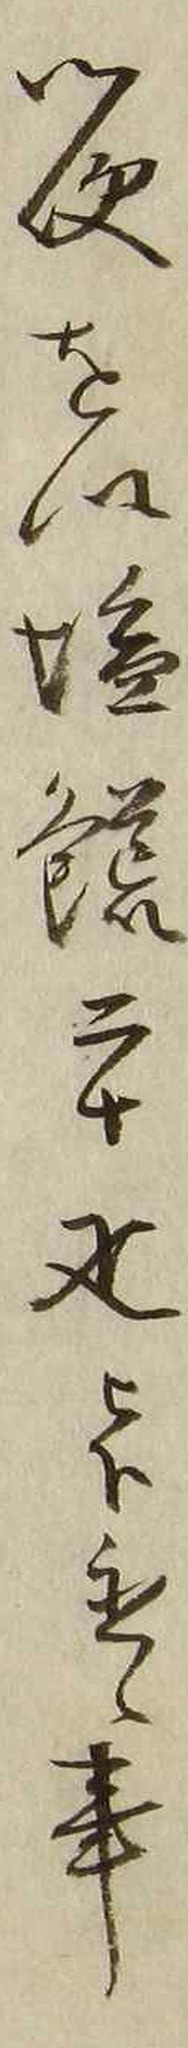御使を以塩二十疋被下置候事
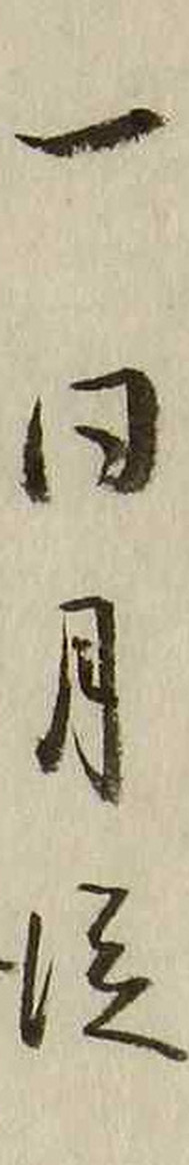一同月従
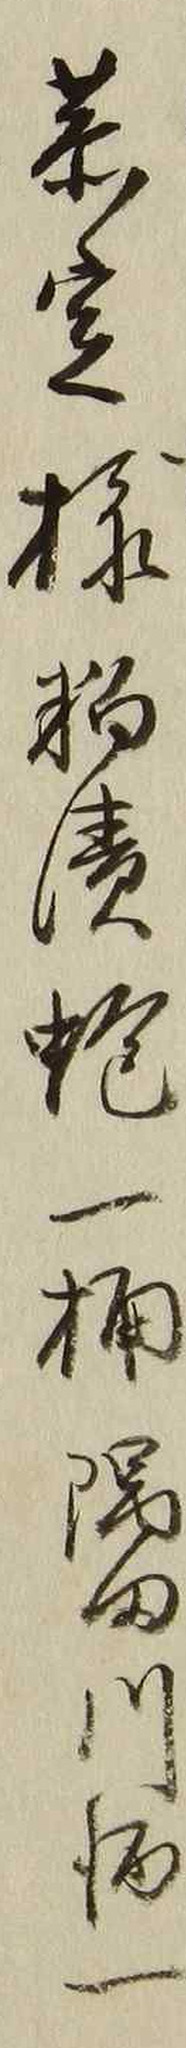恭定様粕漬蚫一桶隅田川酒一
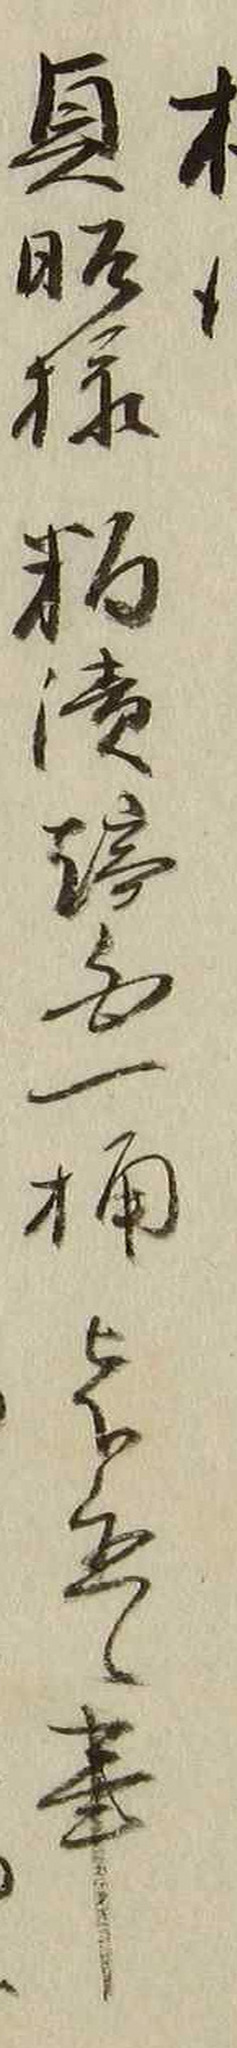貞昭様粕漬端白一桶被下置候事
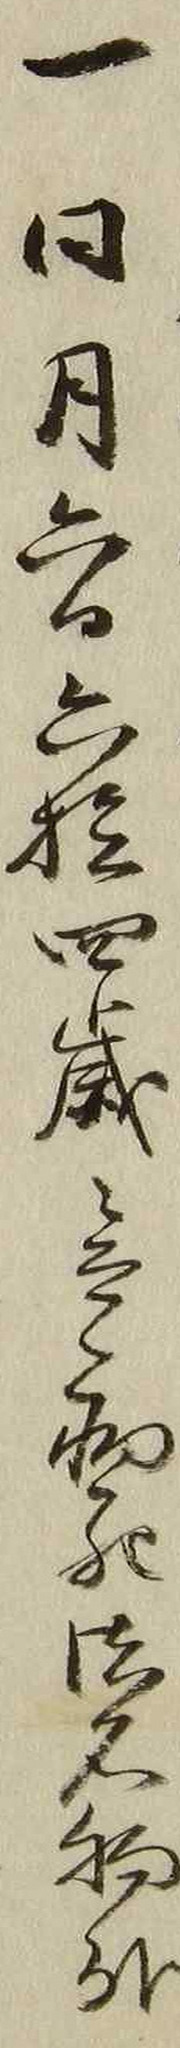一同月六日六拾四歳に而病死法名物外
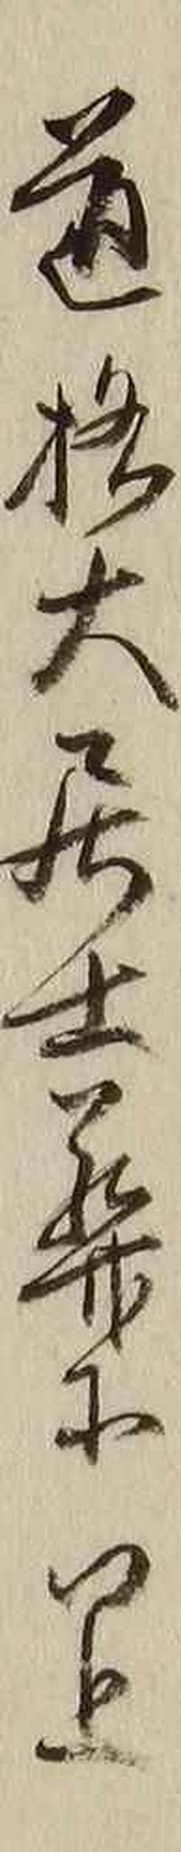道格大居士葬所同上
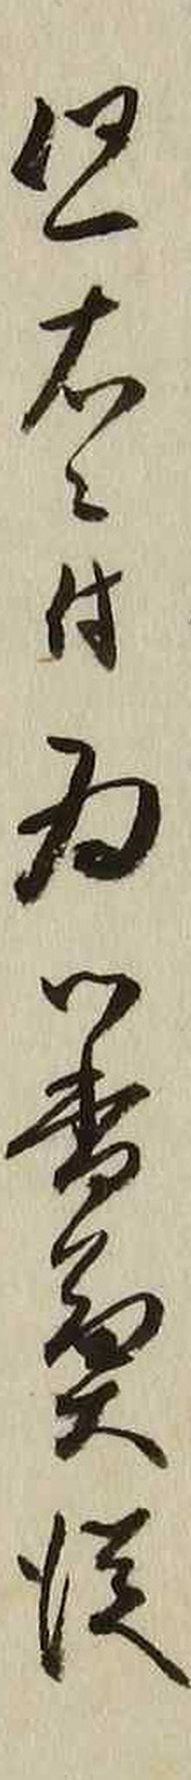但右に付為御香典従
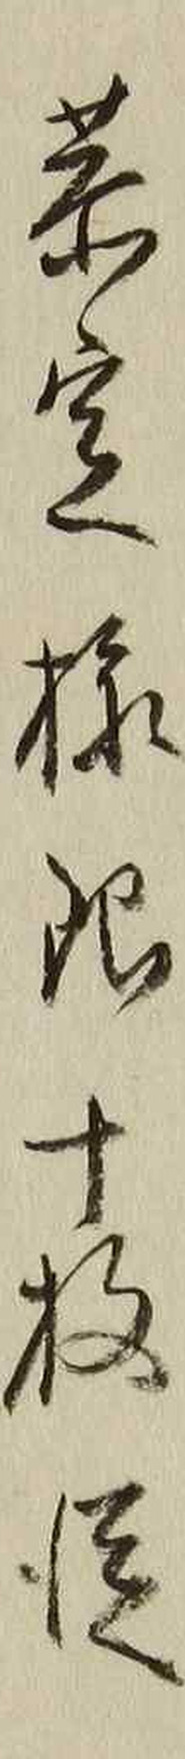恭定様銀十枚従
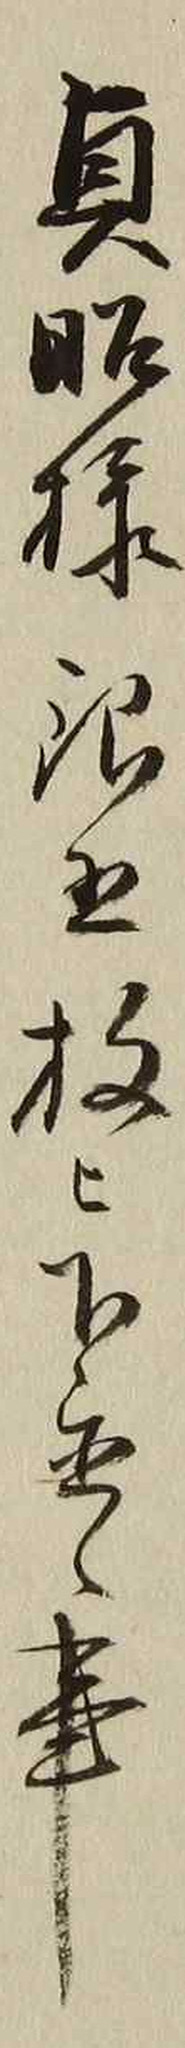貞昭様銀五枚被下置候事
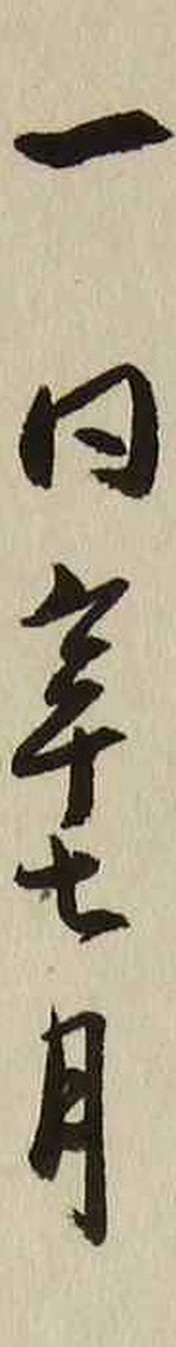一同年七月
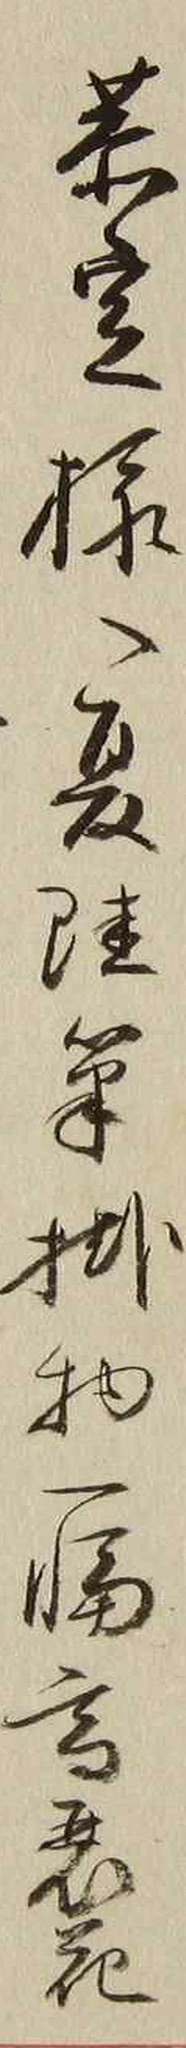恭定様へ夏陸筆掛物一輻高恋花
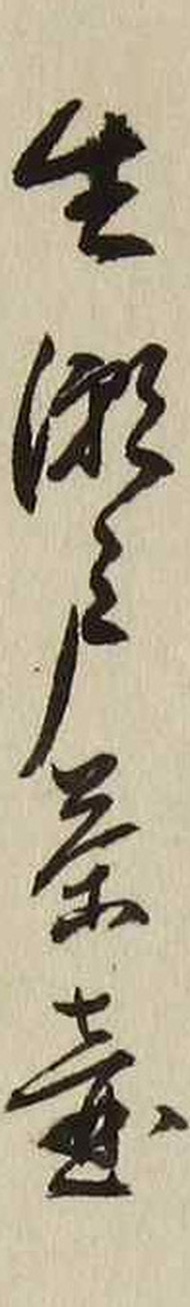生瀬戸茶壺
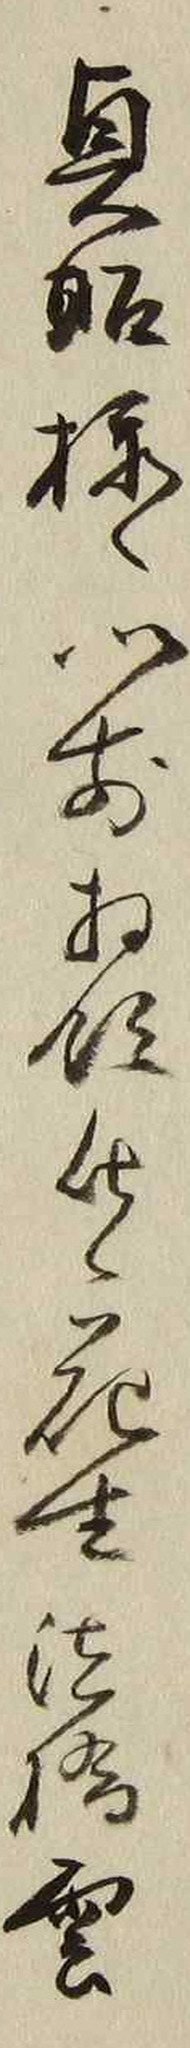貞昭様へ以前拝領仕候花生諸橋雲
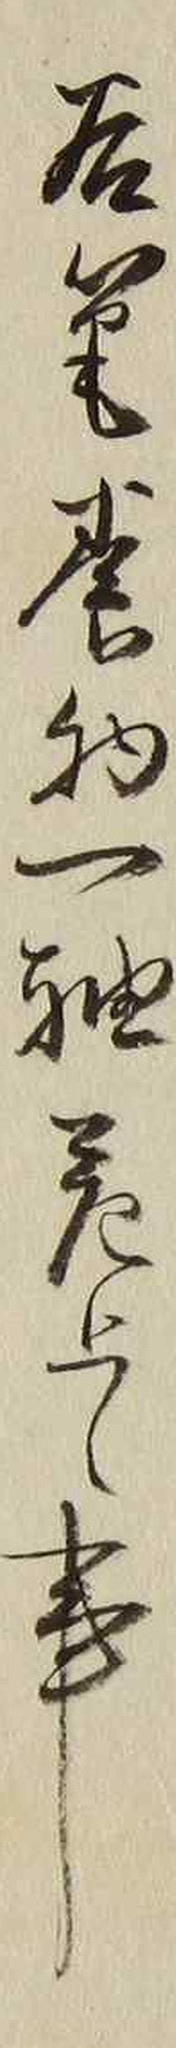居筆巻物一軸差上候事
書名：諸士系譜　巻之292　き之部1
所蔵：会津若松市立会津図書館
